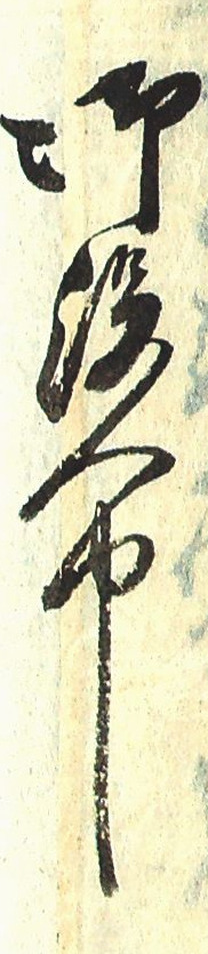御役人中
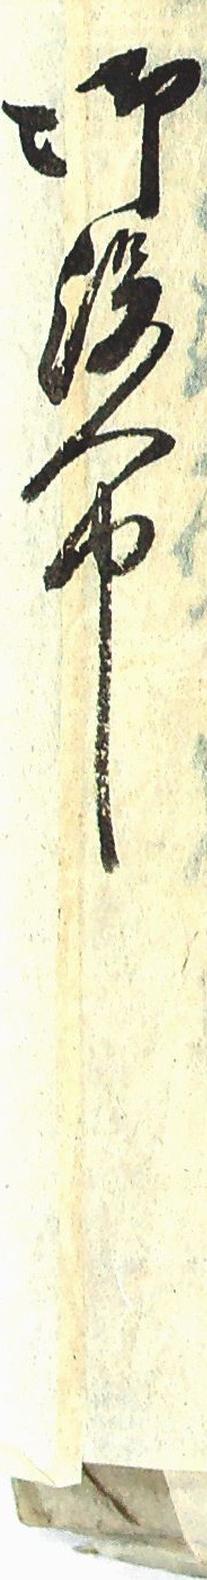御役人中

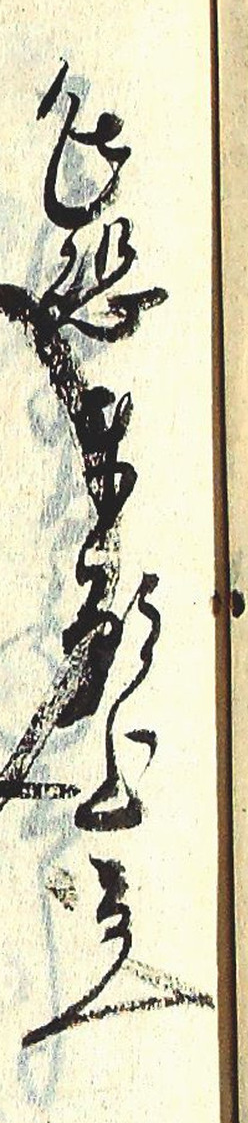乍恐奉願上覚
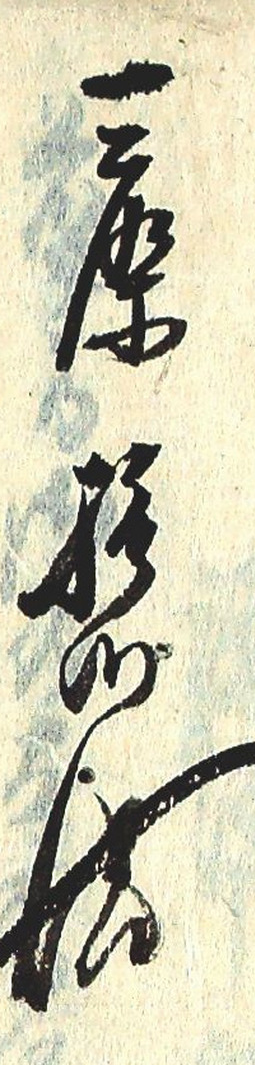一蒅拾弍俵
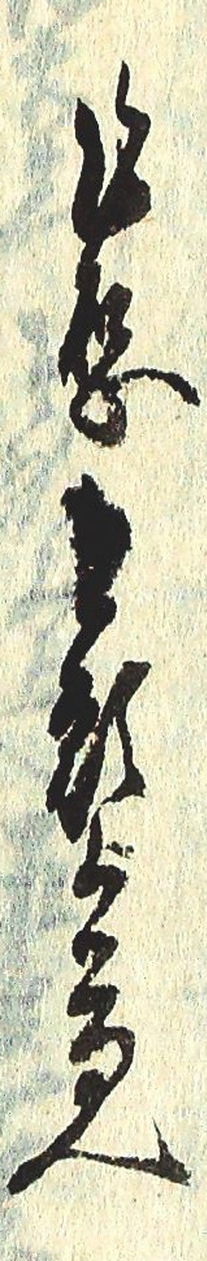乍恐奉願上覚
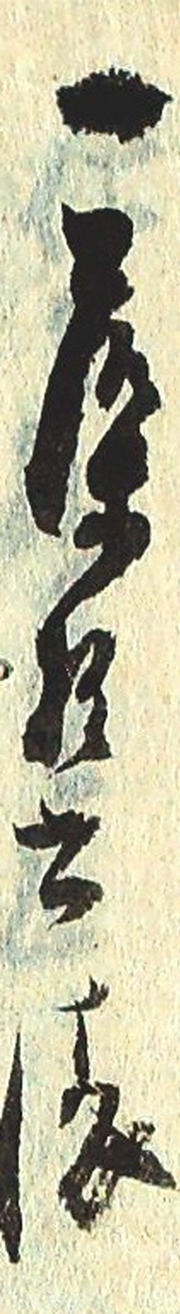一蒅拾六俵
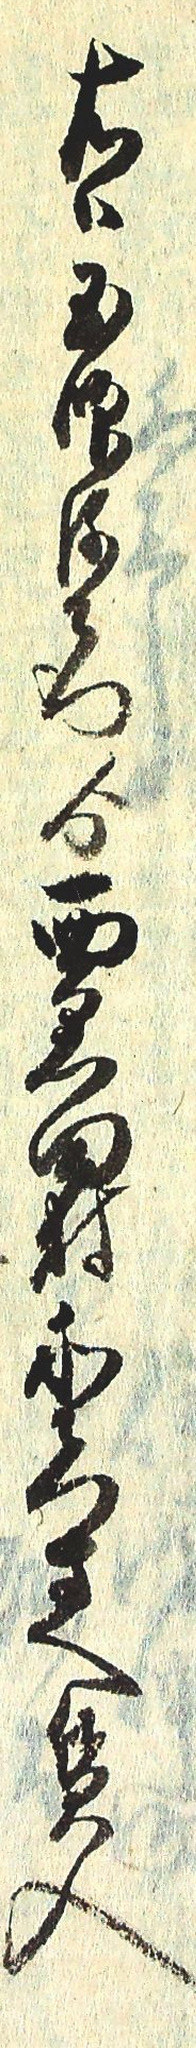右は玉師弥右衛門ゟ西黒田村和右衛門方へ質入
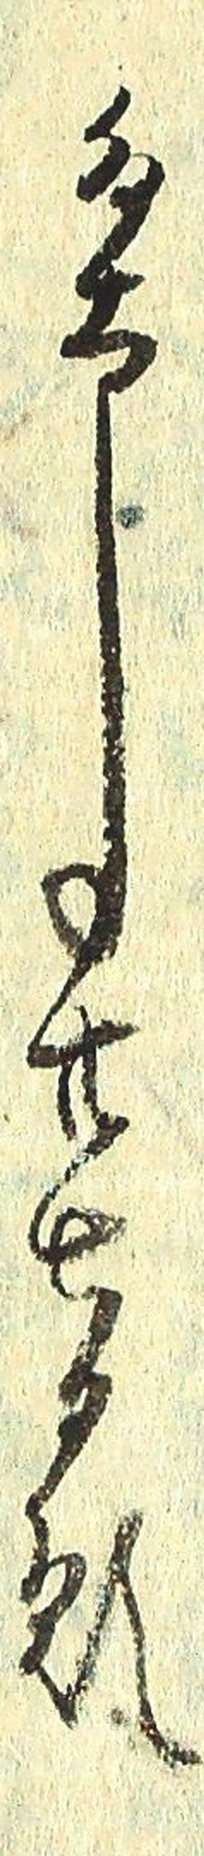卯十一月廿七日願
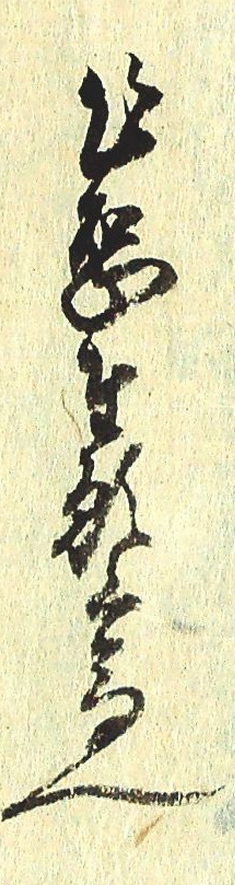乍恐奉願上覚
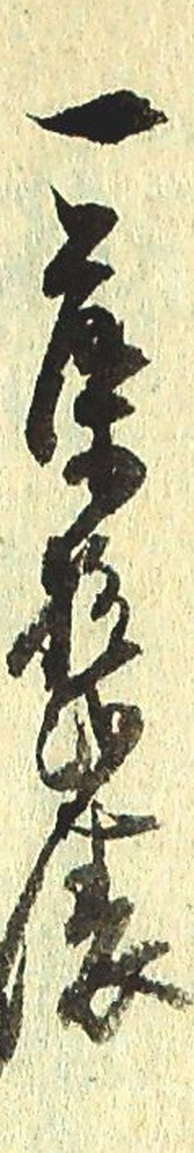一蒅拾弍俵
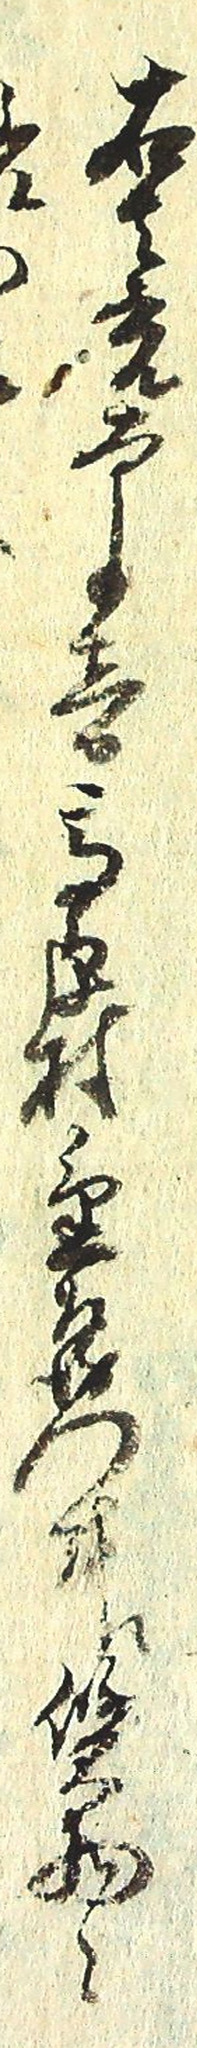右は去る十一月十二日高原村金左衛門方え質物に
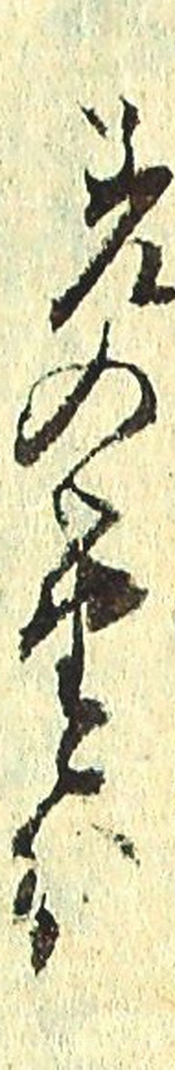差入御座候分
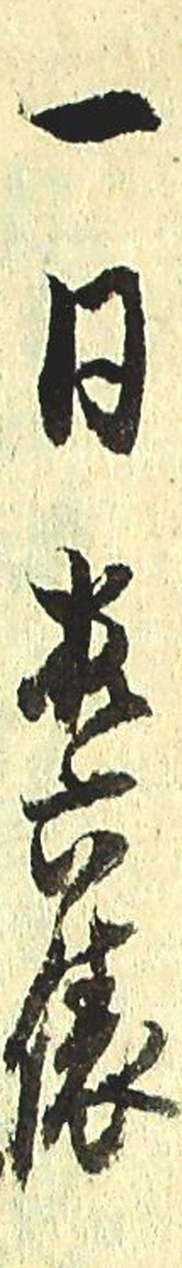一同拾六俵
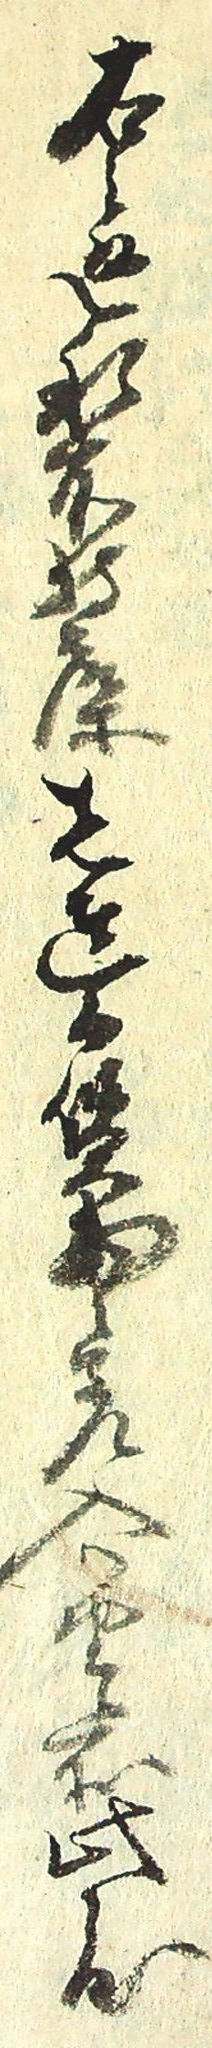右之通私所持蒅先達て質物に差入御座候所此度
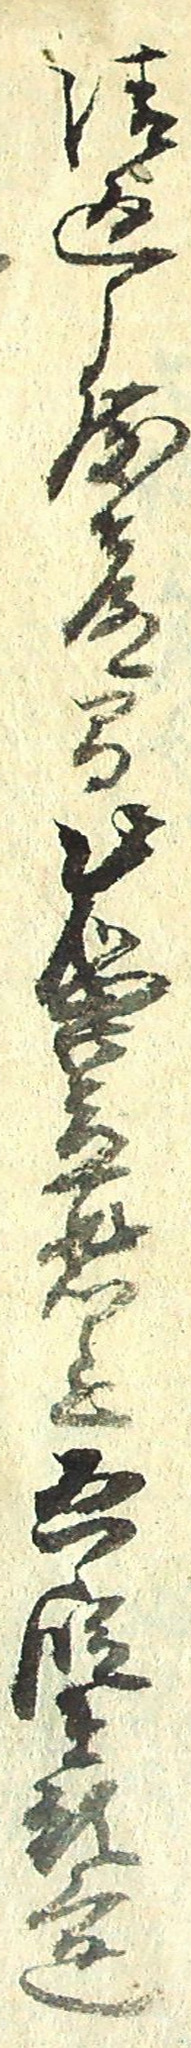請返し度奉存候間乍恐御慈悲之上右之段奉願上通
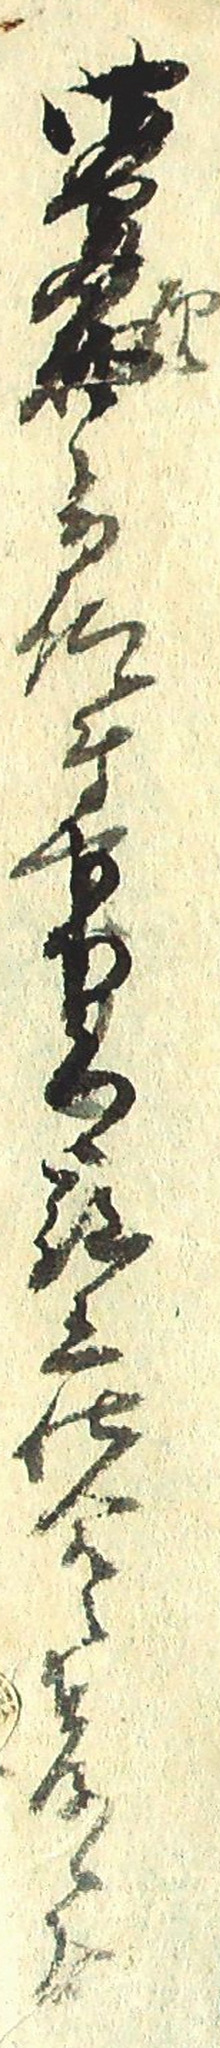御聞届被為仰付被下候はゝ難有仕合に奉存候以上
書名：諸御願書控(弐番）
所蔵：鳴門教育大学 Naruto University of Education
